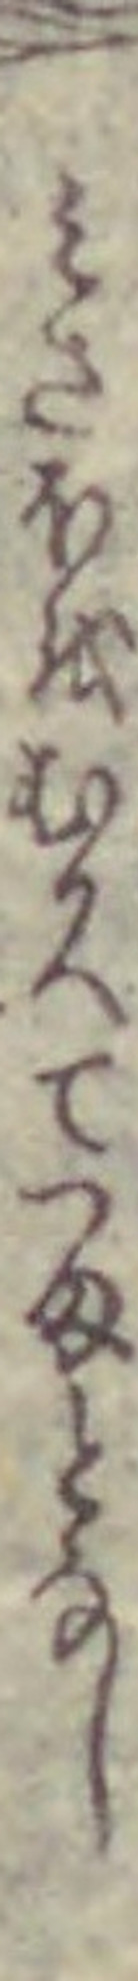みさほをむかへてつまとなし
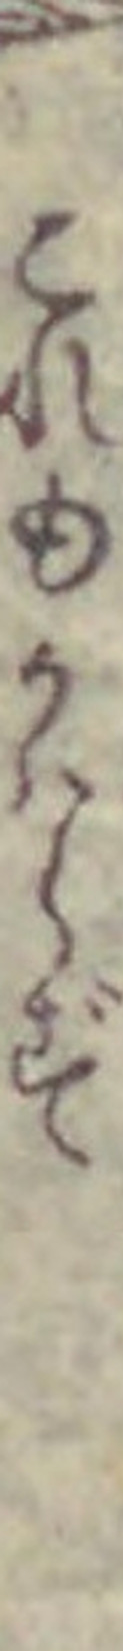これもかはらず
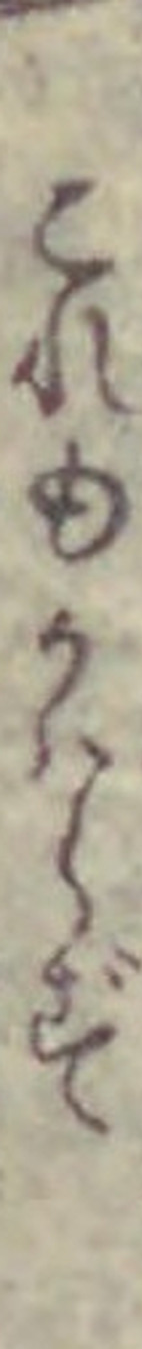これもかはらず
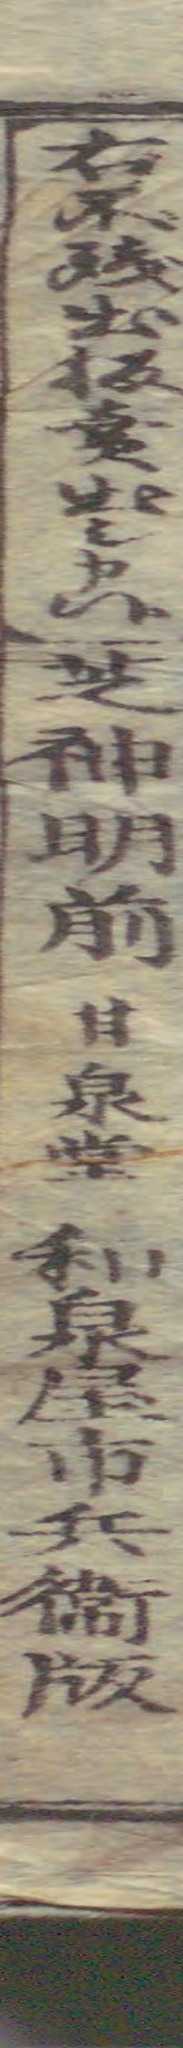右不残出板売出し申候芝神明前甘泉堂和泉屋市兵衛版

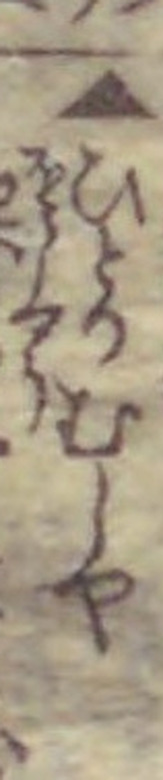▲ひとりむしや
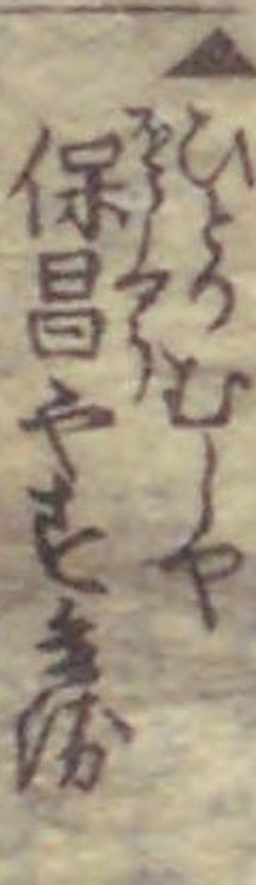保昌やす兵衛

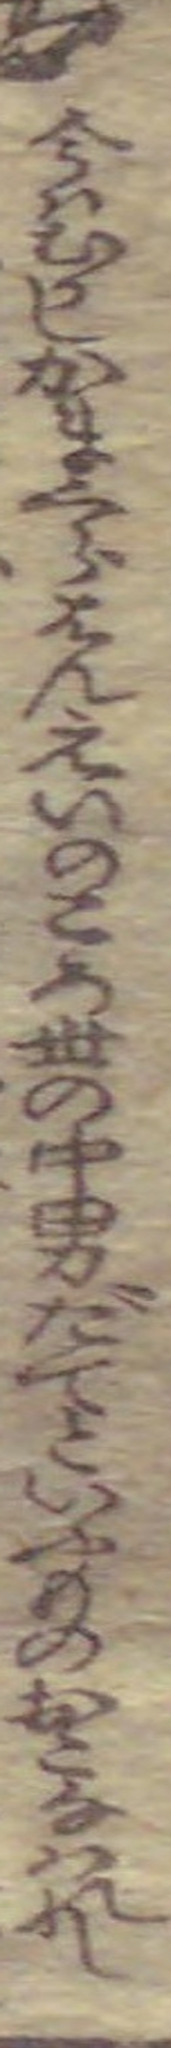今はむかしかまくらはんえいのころ世の中だてといふものおこなはれし
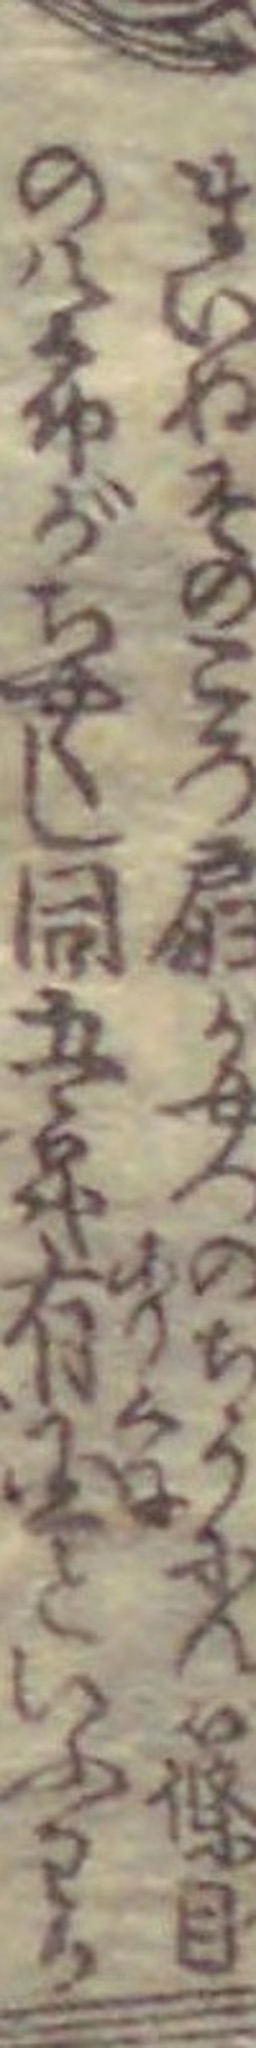の八郎がちやくし同五郎有国といふわか
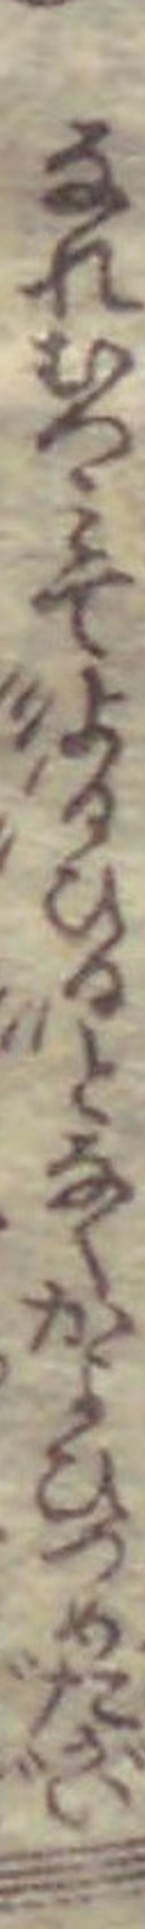なれむつみてよるひるとなくかよひつめたがい
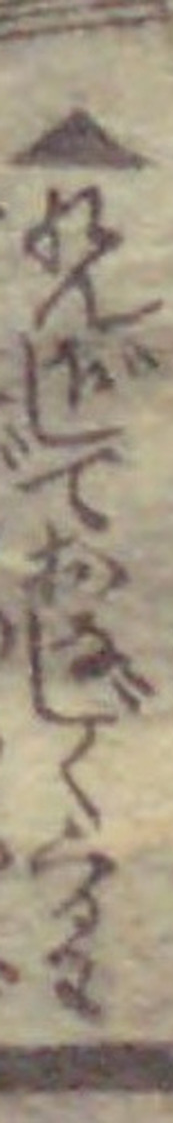▲れんぼしておなじくくるわ
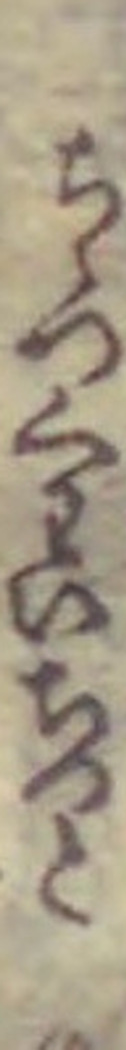ちゝつくわいちつと
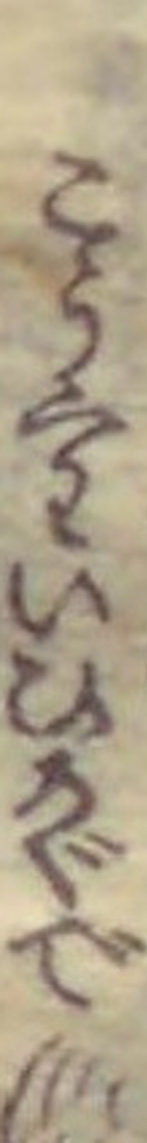こうくわいひろぐで
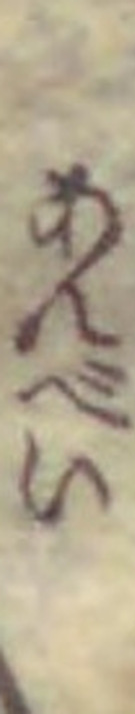あんべい
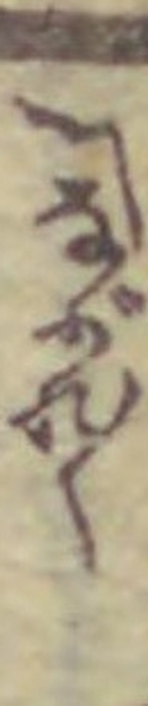〽なぶれ〳〵
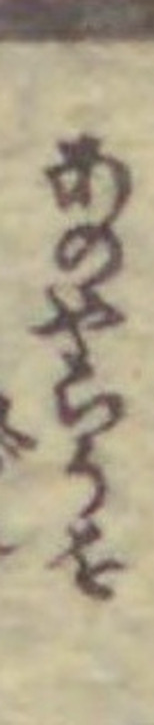あのやらうを
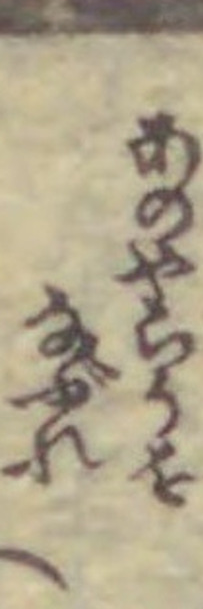なぶれ
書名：八ツ目鱣因縁物語 3巻
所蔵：国立国会図書館 National Diet Library, JAPAN
